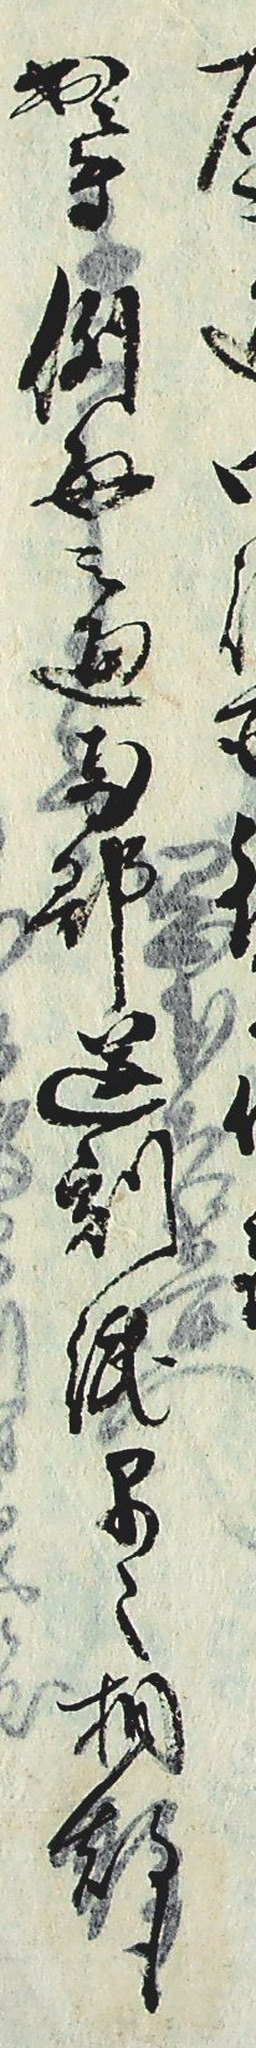出に付例毎之通前郡送割賦早々相都め

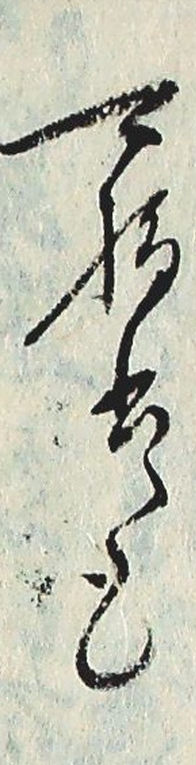可指出候以上
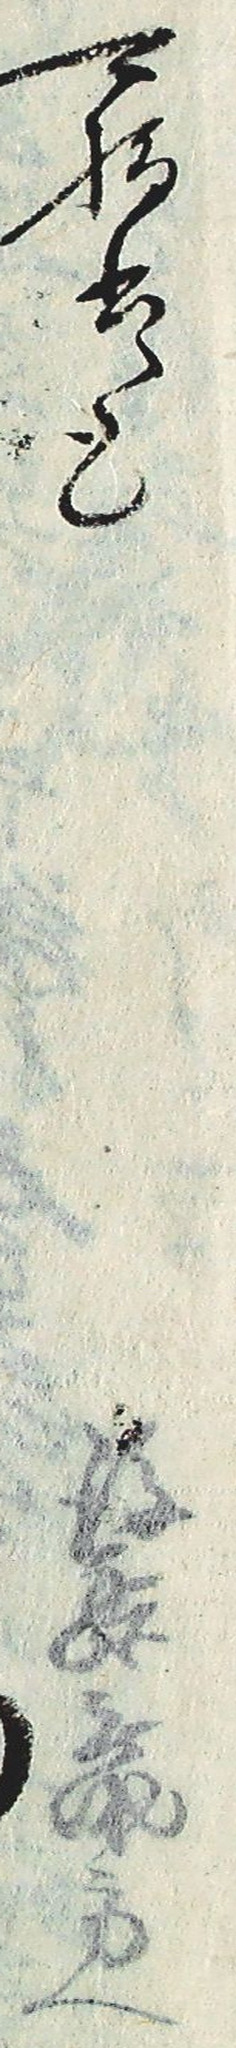可指出候以上
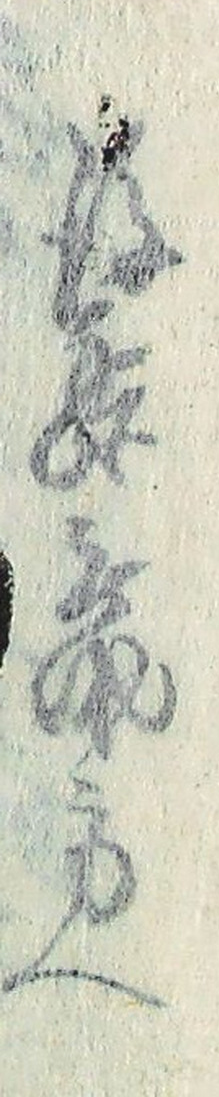後藤庄助方へ
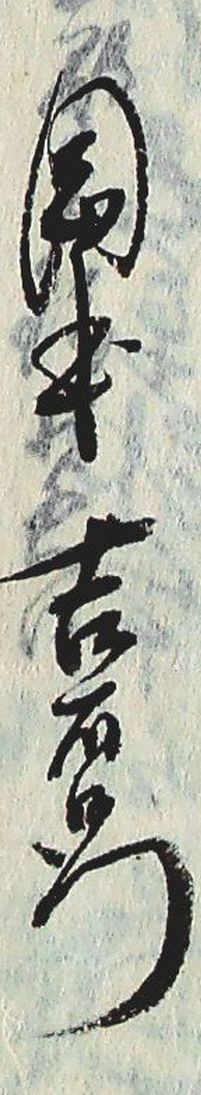岡本吉右衛門
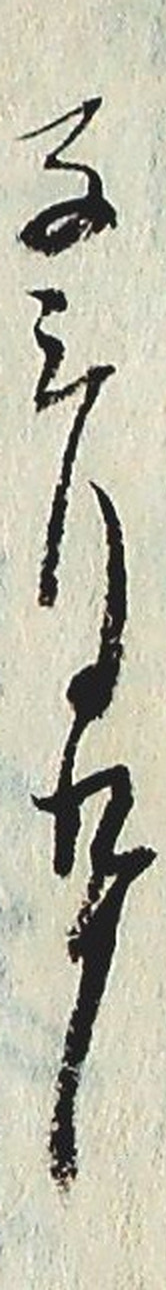子三月九日
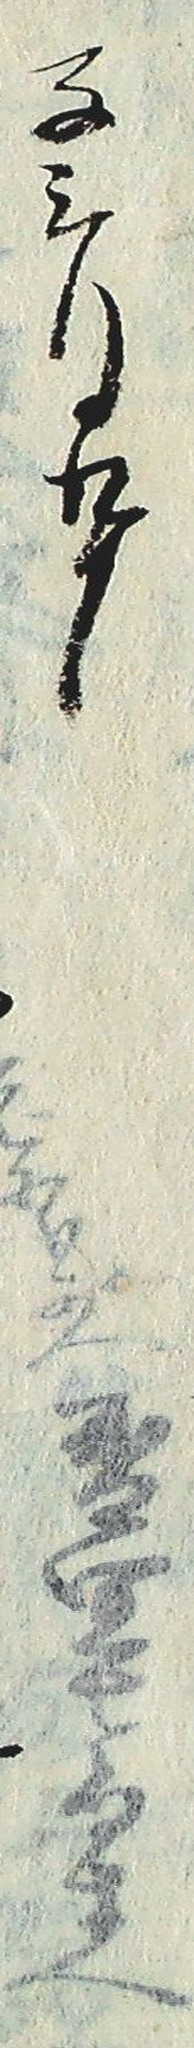子三月九日
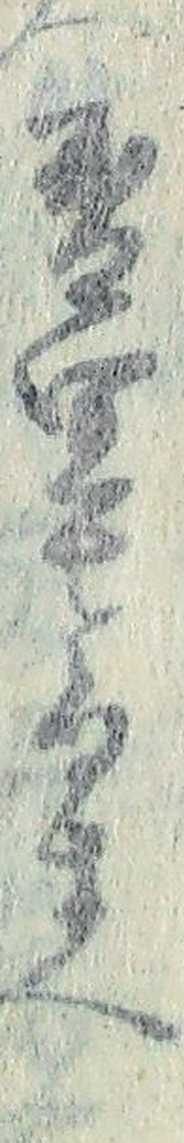盛宣七郎方へ
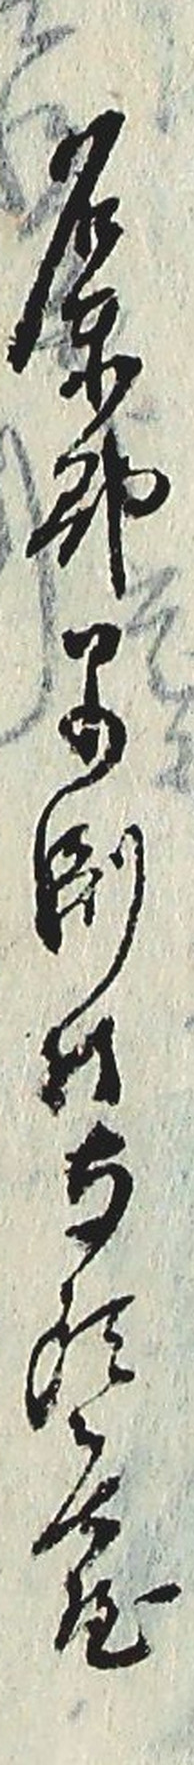名東郡早淵村与頭庄屋
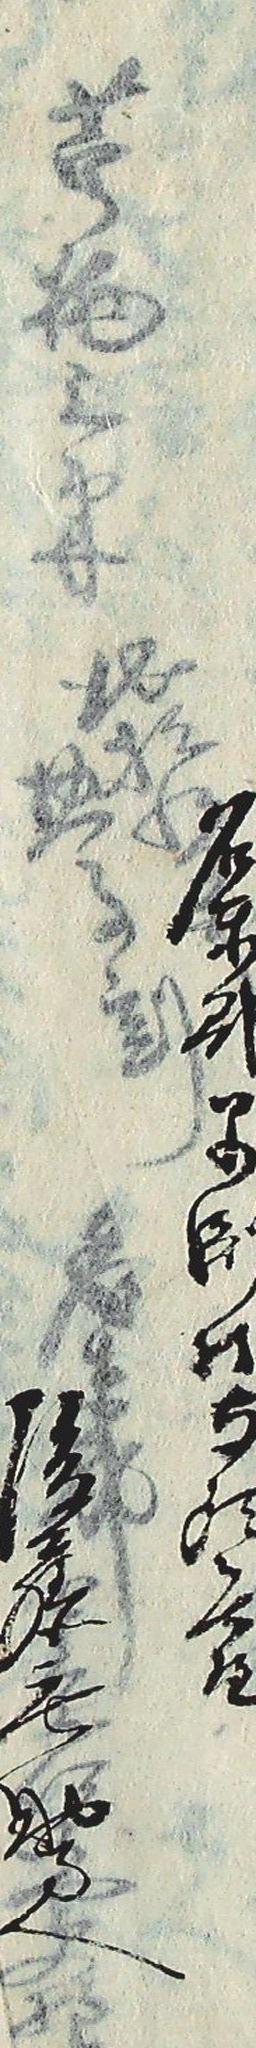後藤庄助方へ
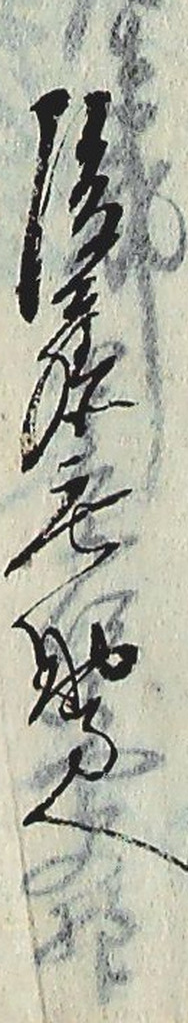後藤庄助方へ
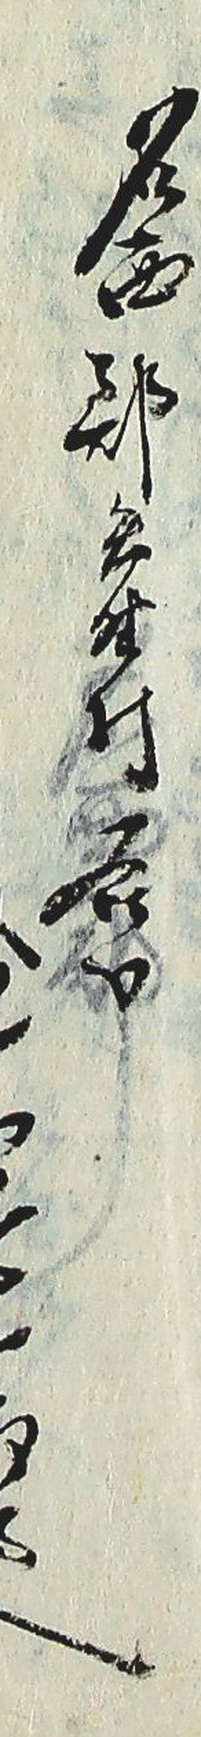名西郡矢野村右同
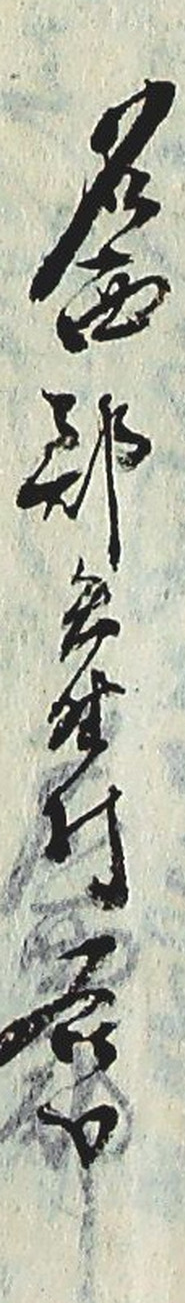名西郡矢野村右同
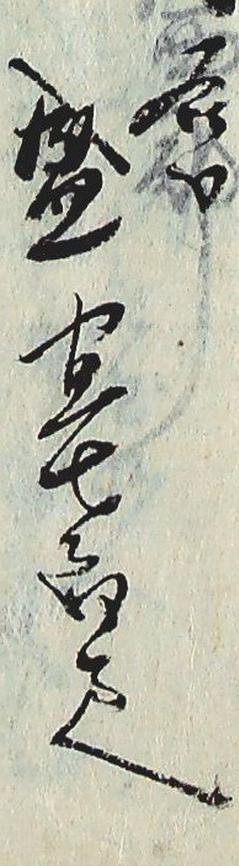盛宣七郎方へ
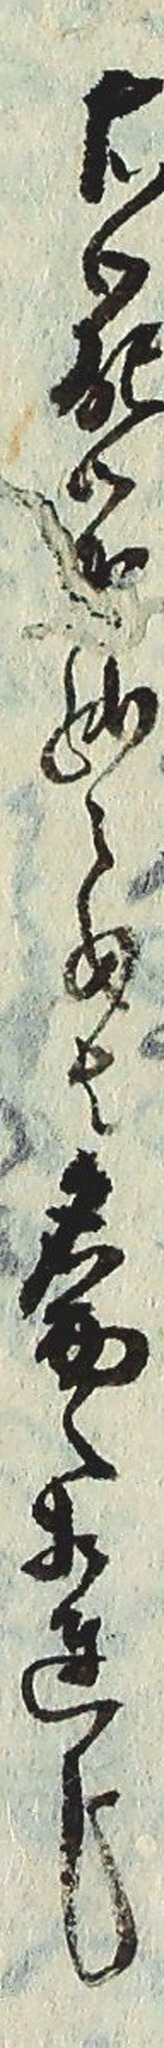右御配御本紙之義は名西へ相達申候
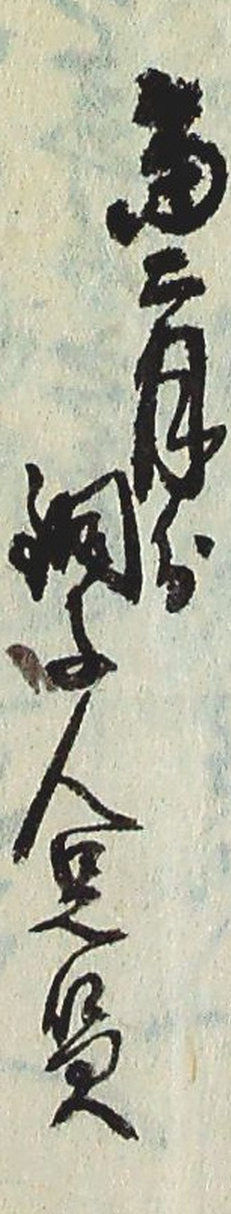銅子人足賃
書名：名東郡中諸割賦元帳
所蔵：鳴門教育大学 Naruto University of Education
